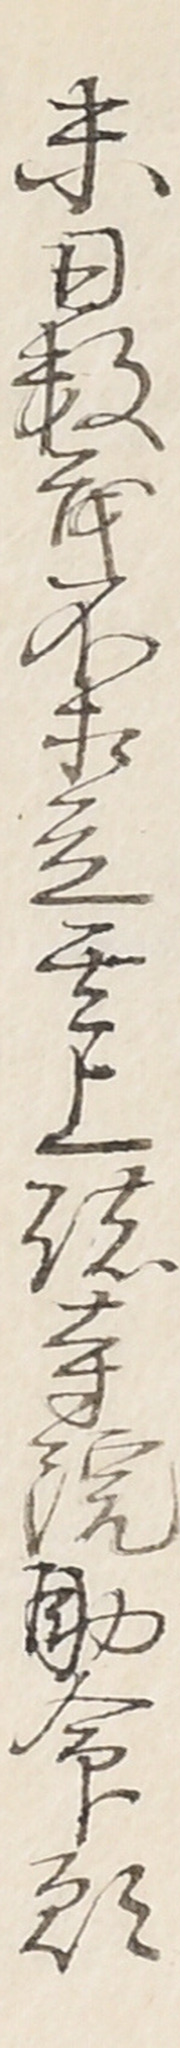未日数も不相立其上諸寺院助命願
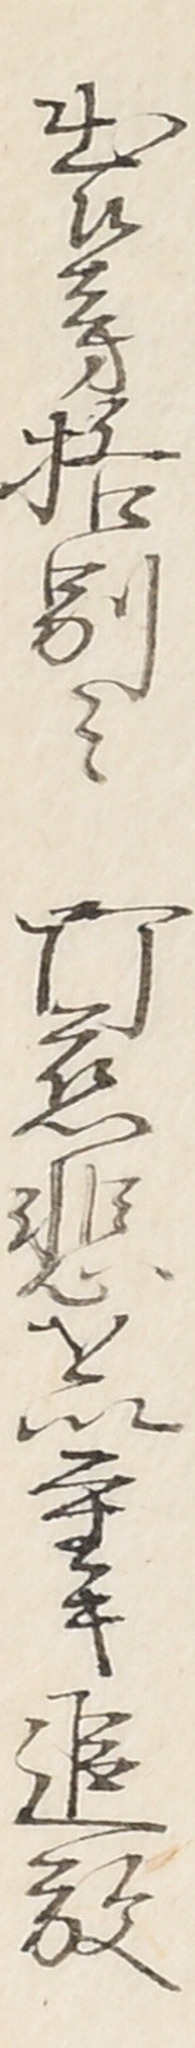出候旁格別之御慈悲を以重キ追放
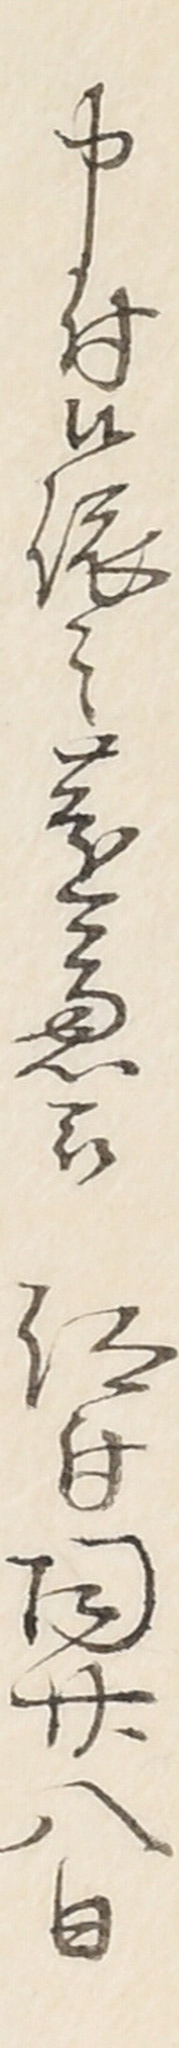申付候依之遠慮被仰付同廿八日
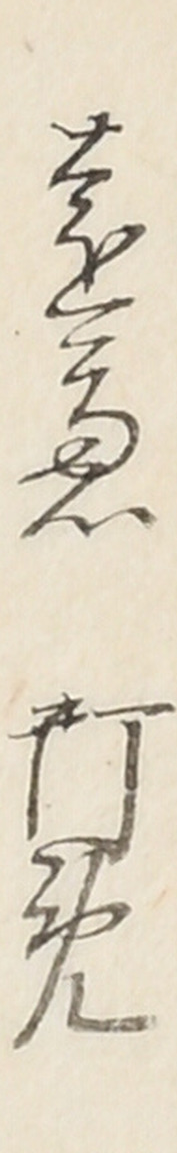遠慮御免
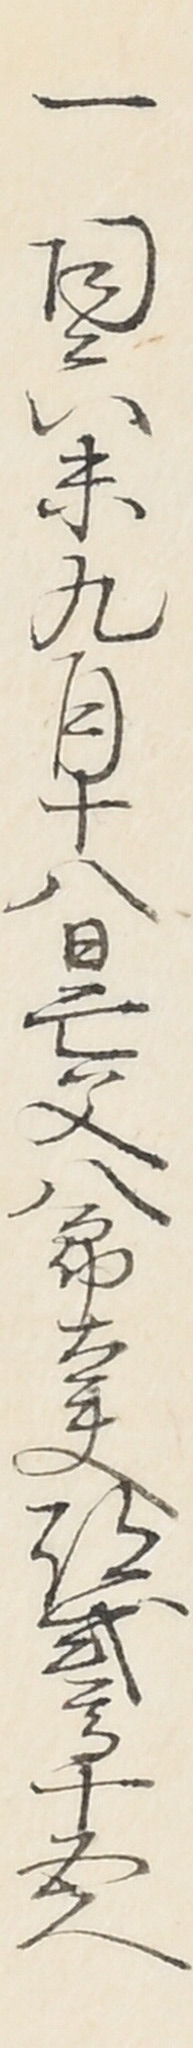一同六未九月十八日亡父八郎太夫跡式高十五人
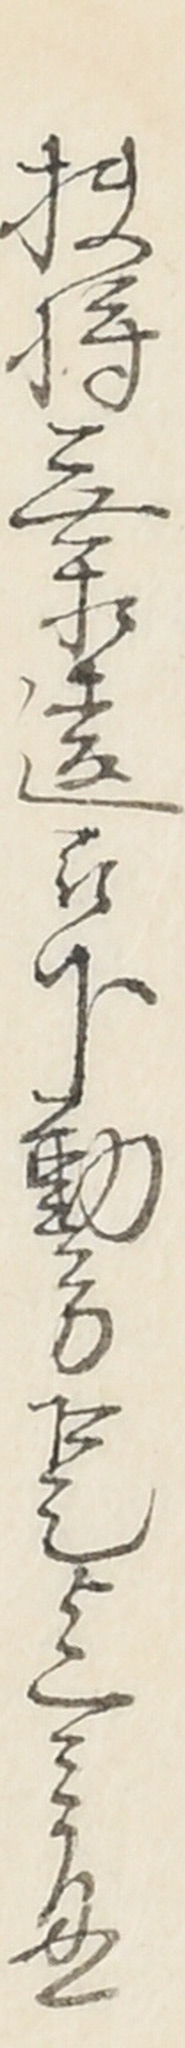扶持無相違被下勤方是迄之通
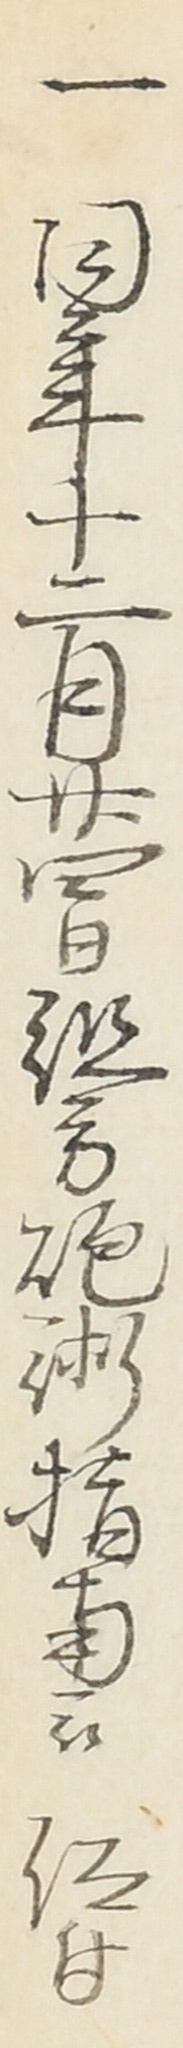一同年十二月廿四日組方炮術指南被仰付
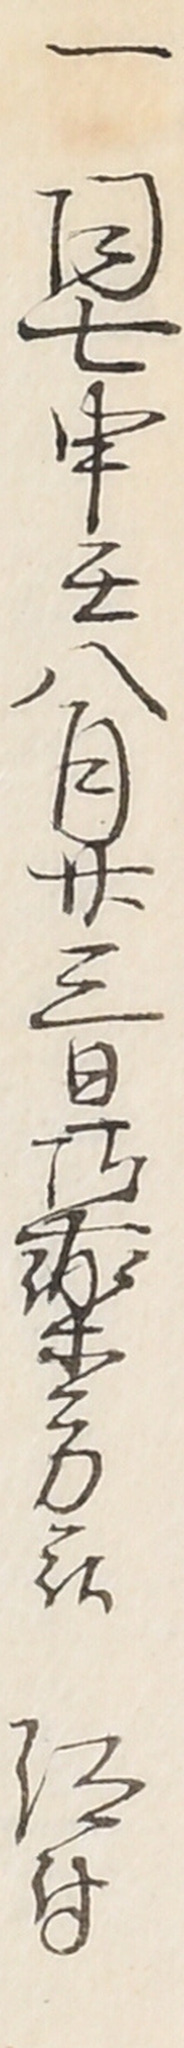一同七申閏八月廿三日御薬方被仰付
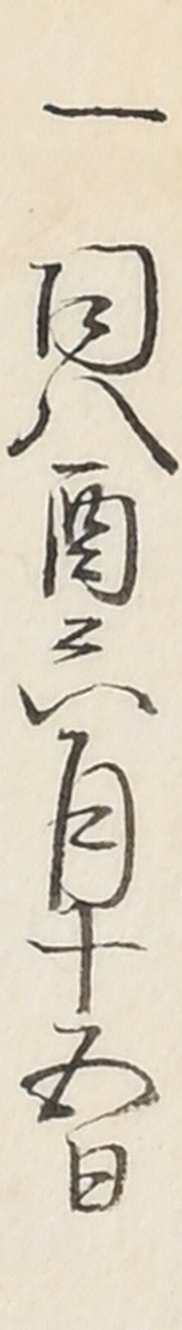一同八酉六月十五日
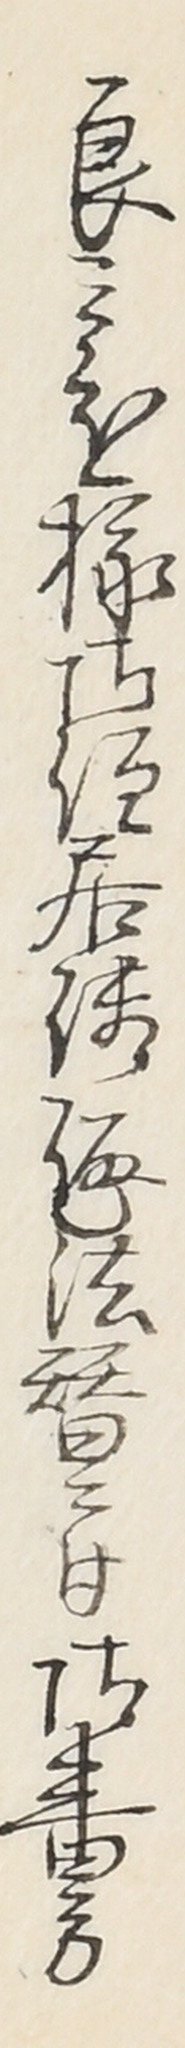良之進様御住居趣法替ニ付御番方
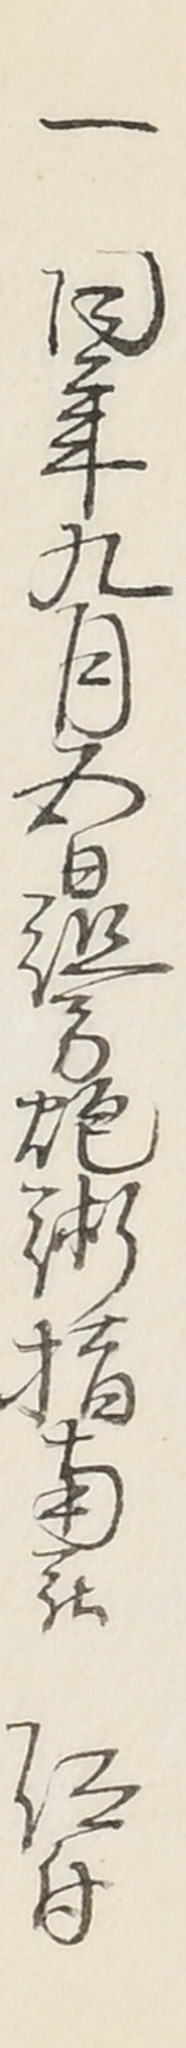一同年九月五日組方炮術指南被仰付
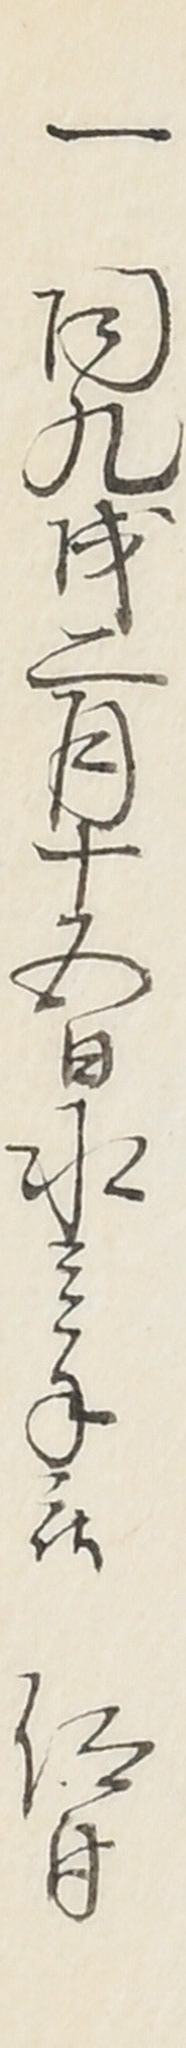一同九戌二月十五日水之手被仰付
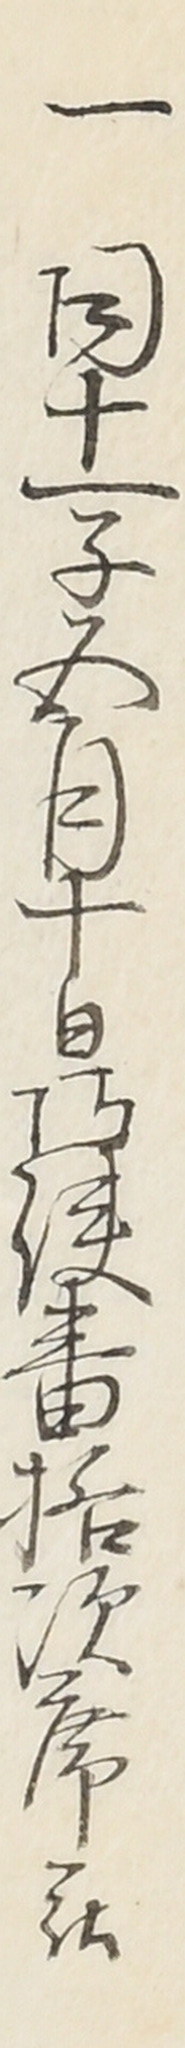一同十一子五月十日御使番格次席被
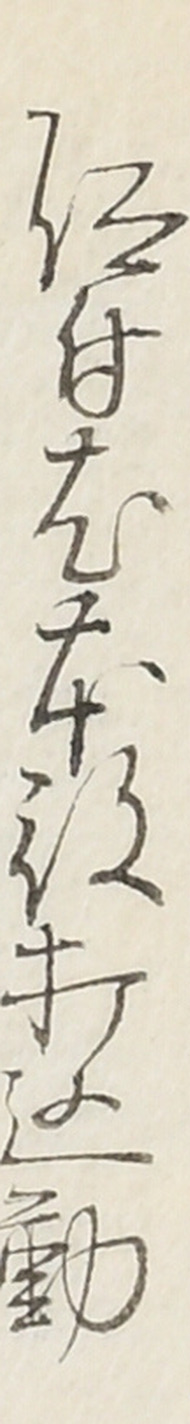仰付尤本役打込勤
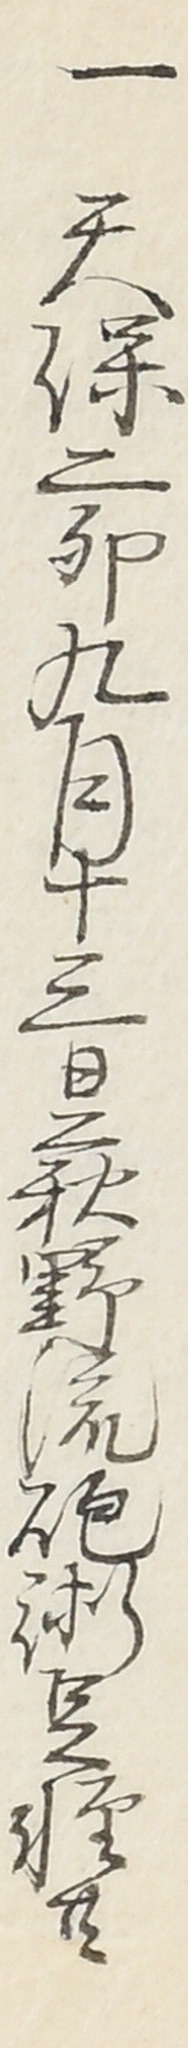一天保二卯九月十三日萩野流炮術足軽共
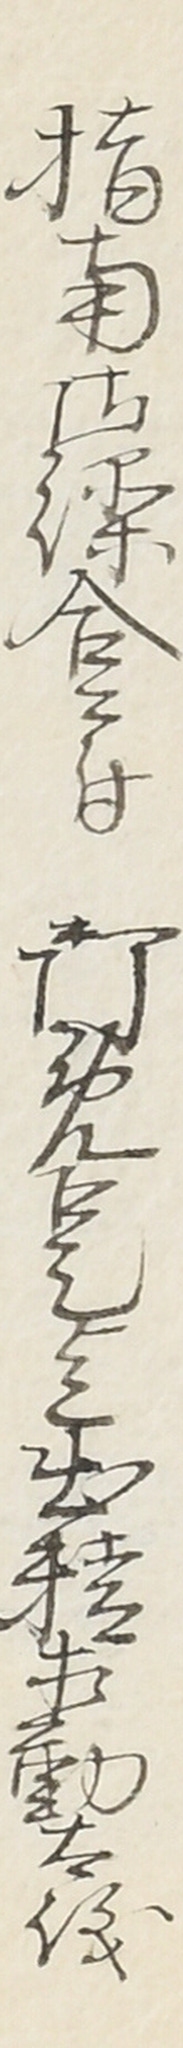指南御繰合ニ付御免是迄出精相勤太儀
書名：給人諸士勤仕録（七）
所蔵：伊那市立高遠町図書館・合同会社AMANE
